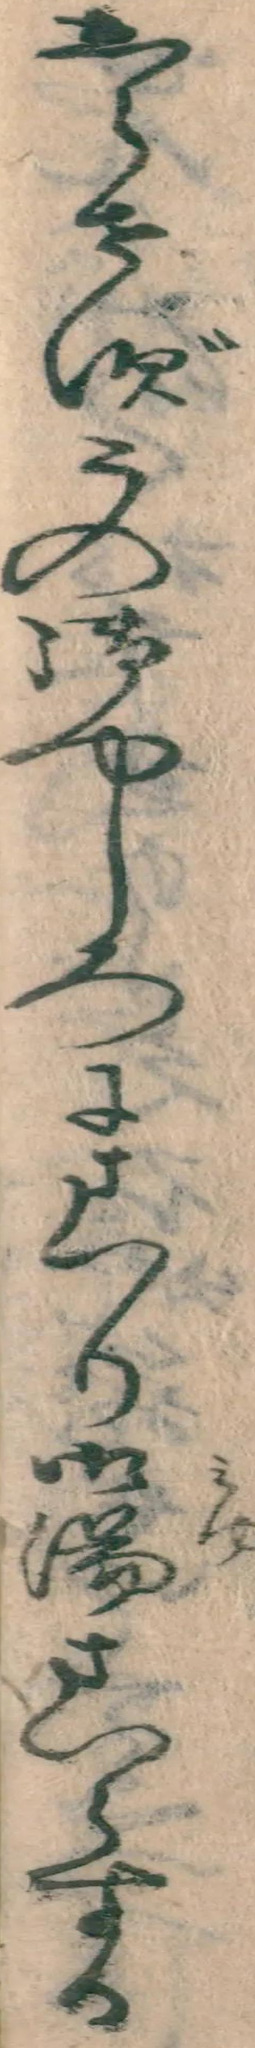しらせずこの御やしろにまつり御湯まいらする
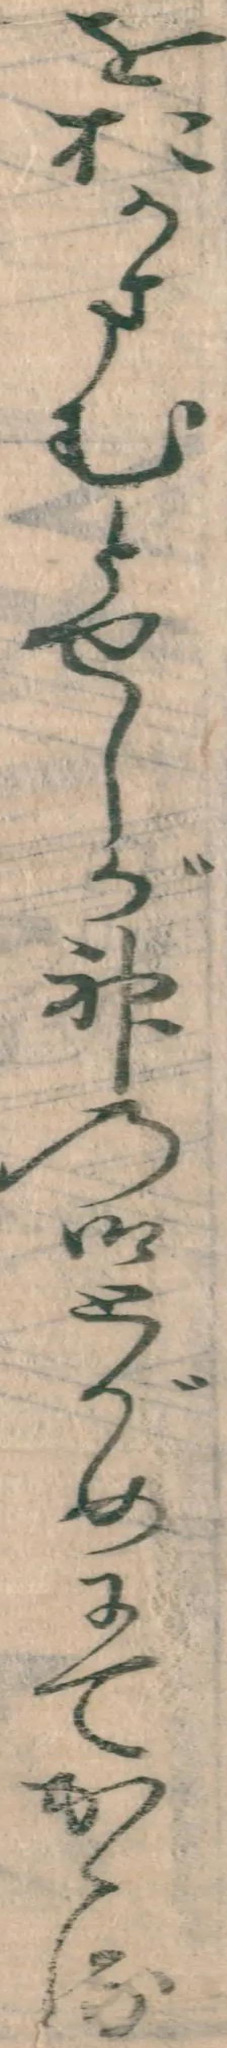をおがまむとせしが神の御とがめにてかゝる
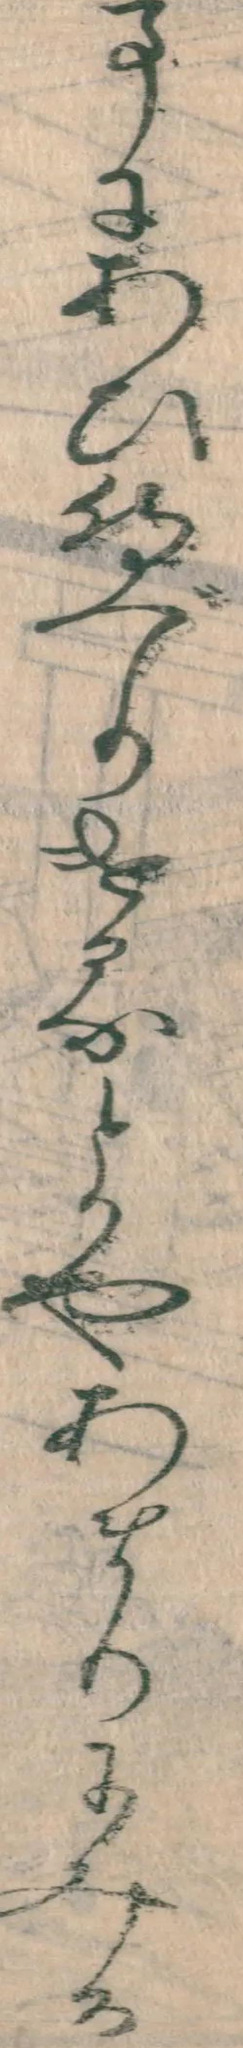事にあひ侍べりけるなとかやあまりにみる
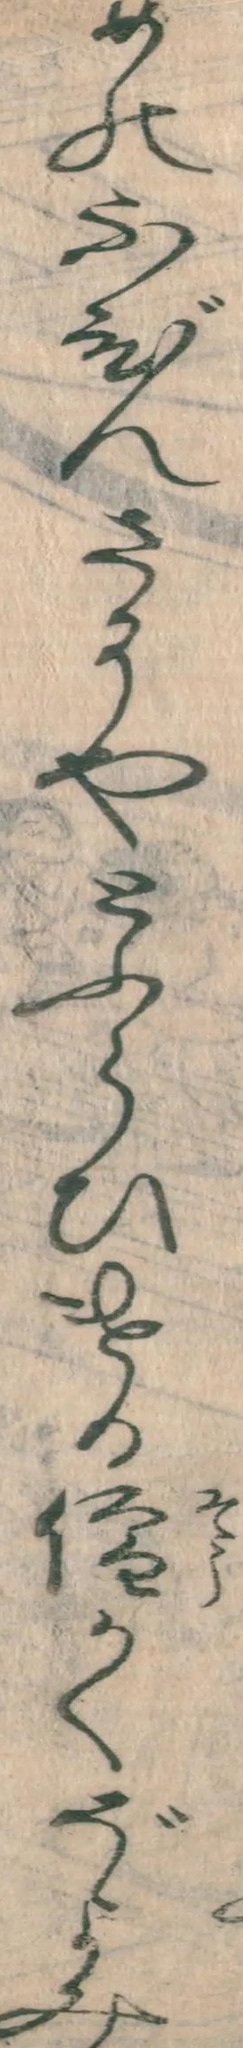めのふびんさるやとふらひける僧かくぞよみ
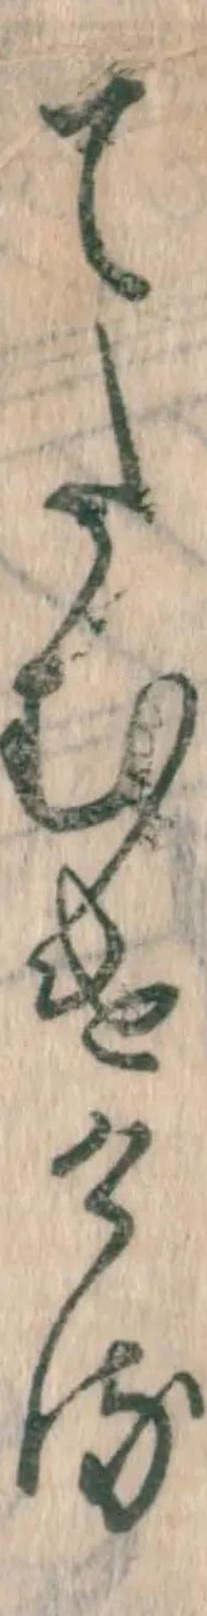てたむけゝる
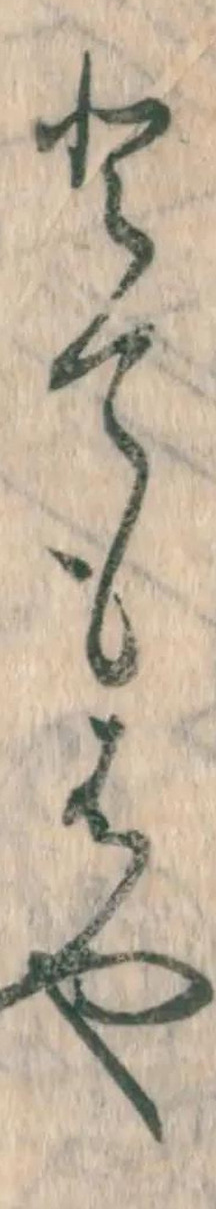とてもはや
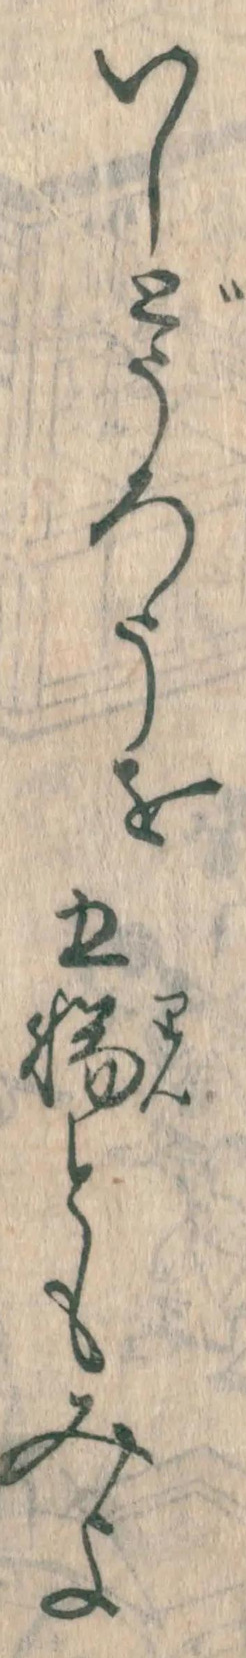いしどうろうを五輪ともみよ

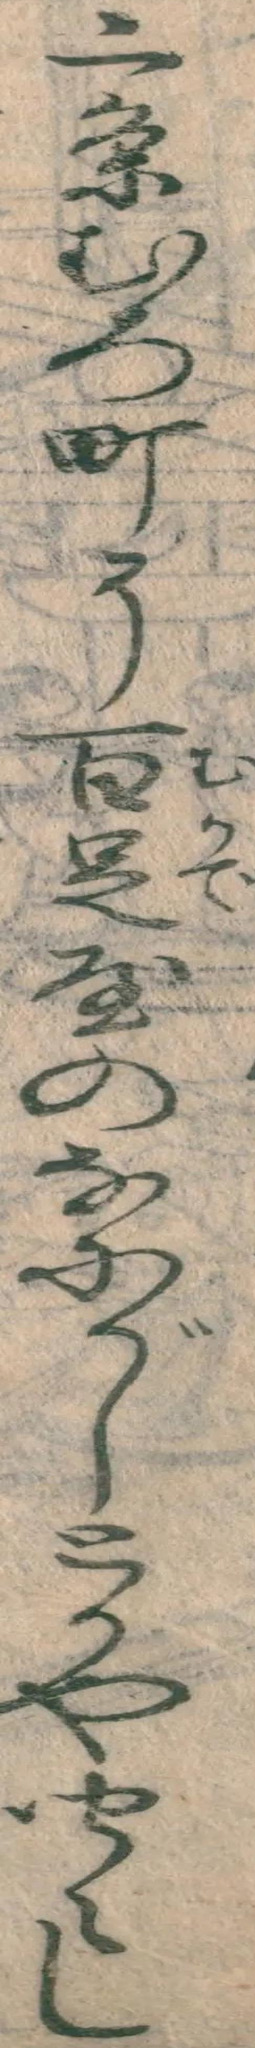二条むろ町」に百足屋のなにがしとかや聞えし
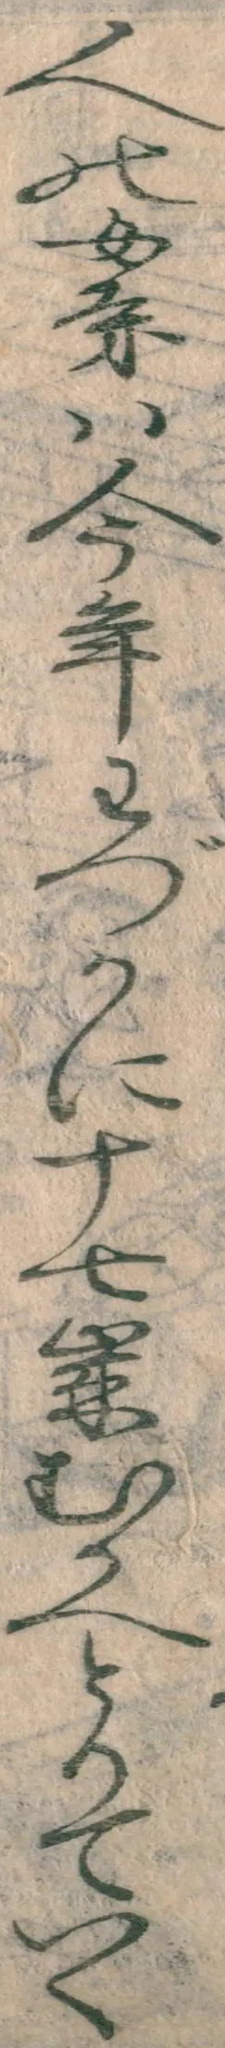人の女房は今年わづかに十七歳むかへとりていく
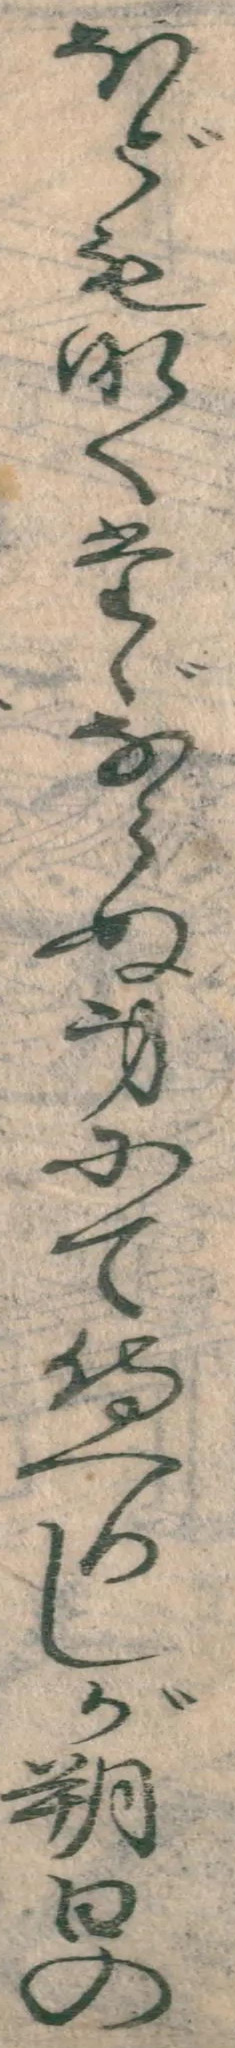ほどもなくたゞならぬ方にて侍りしが朔日の
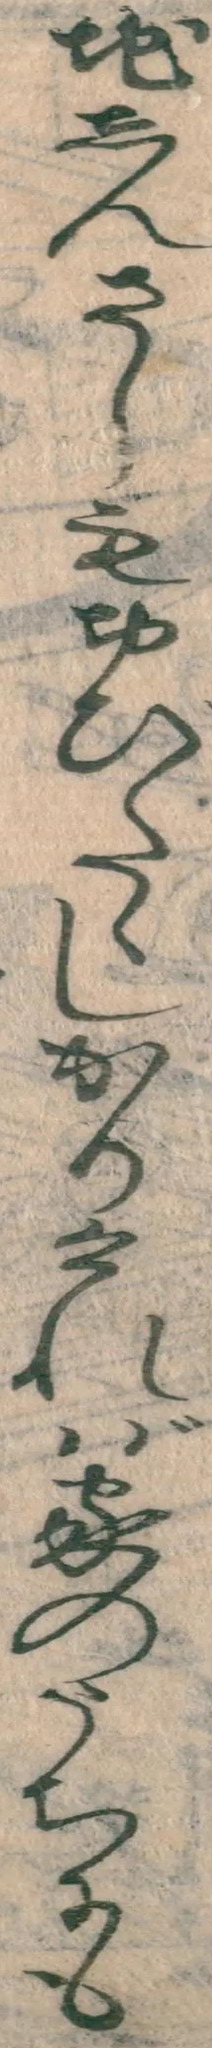地しんさしもおびたゝしかりければ家のうちにも
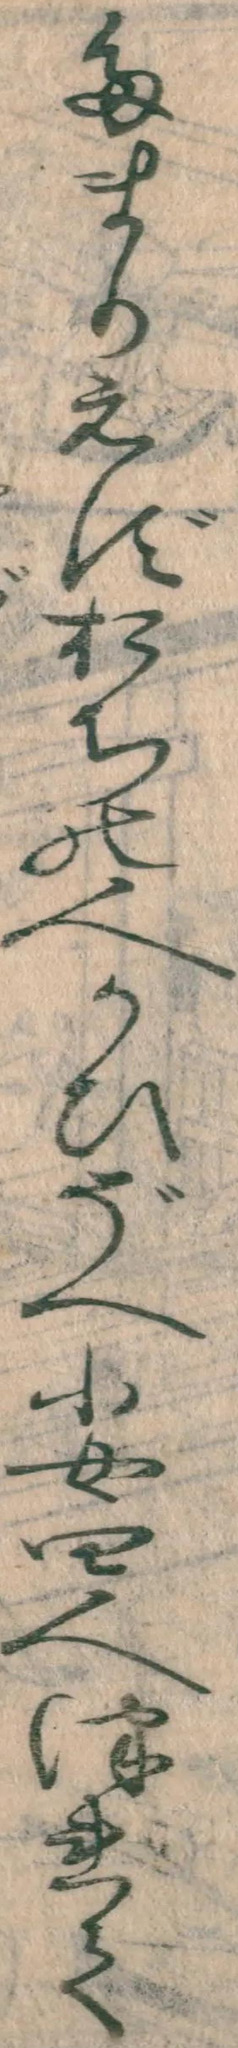たまりえずおちの人かひぞへ小女四人つれて
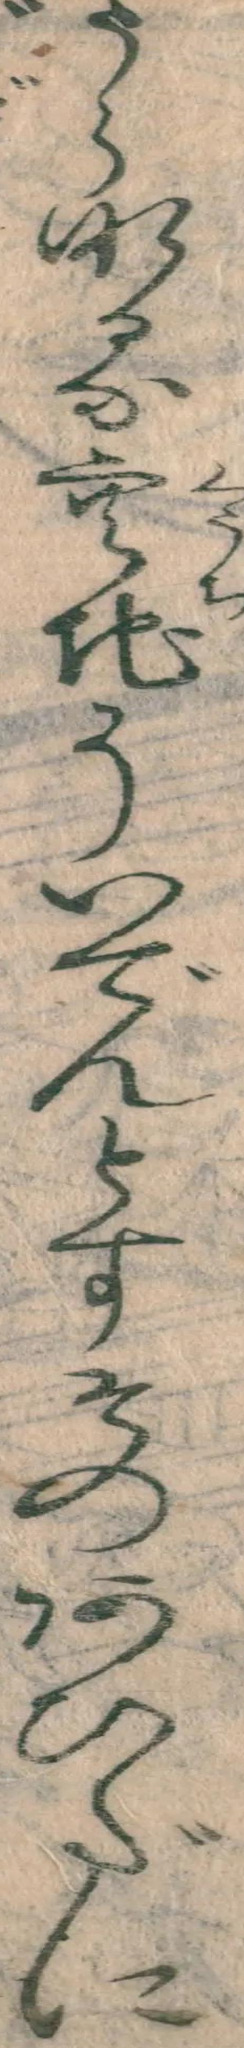うらなる空地にいでんとすそのあひだに
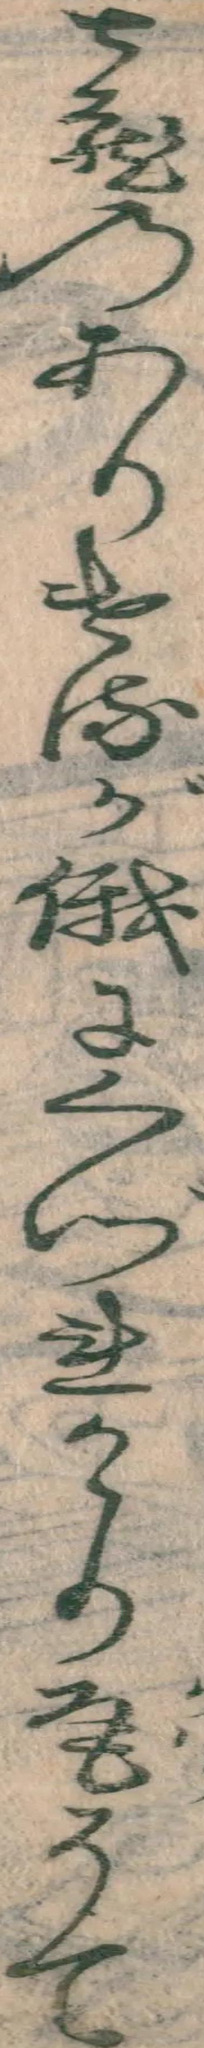土蔵のありけるが俄にくづれかゝり瓦にて
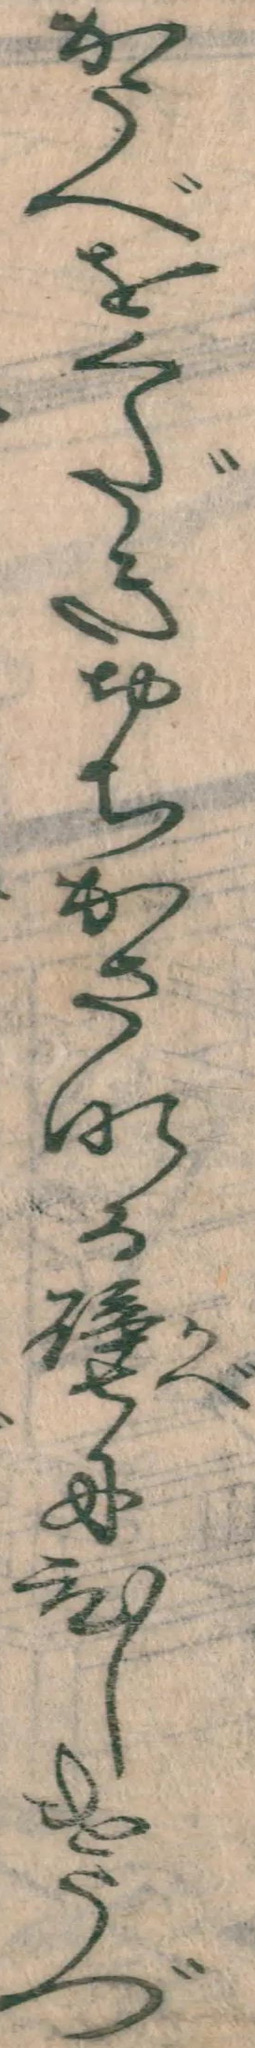かうべをくだきおちかさなる壁にひしけうづ
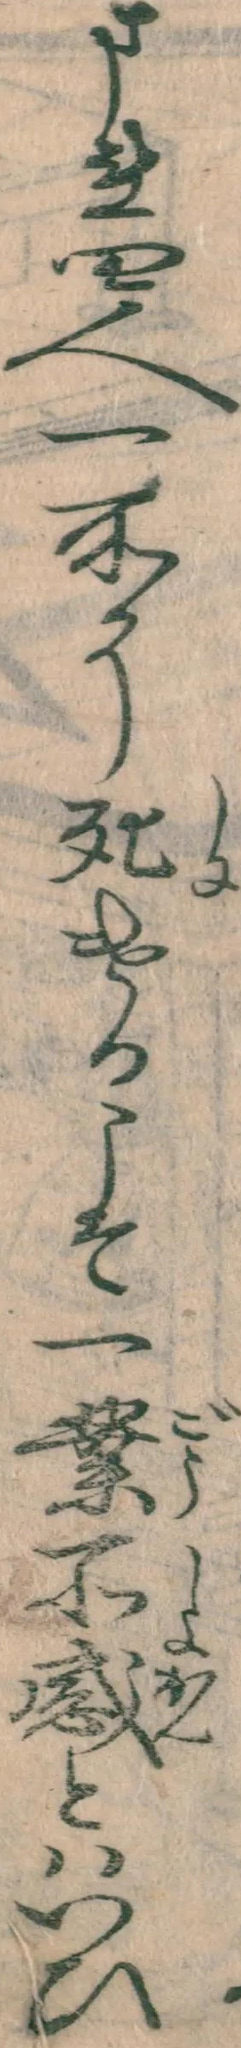まれ四人一所に死けるこそ一業所感とはいひ
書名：艱難目異志. 上,下
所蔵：国立国会図書館 National Diet Library, JAPAN
